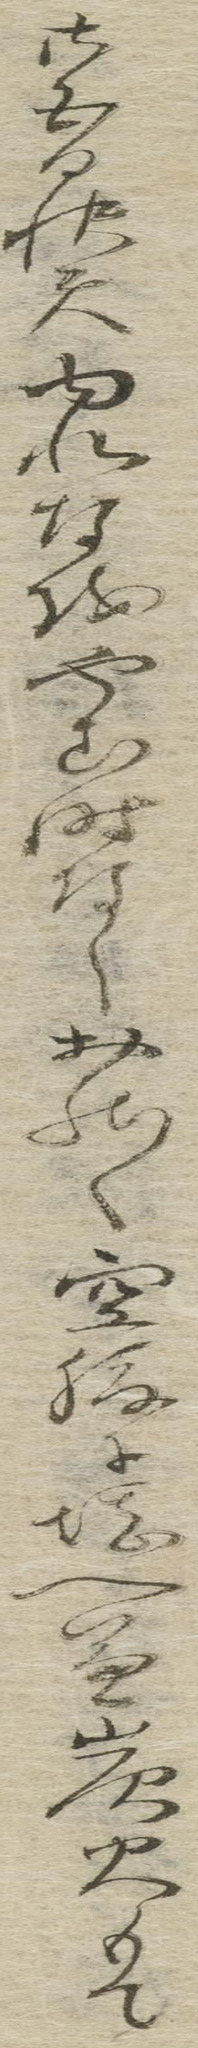廿五日快天ゆれなをやむ時なしおの〳〵空腹に堪へ兼炭火もて
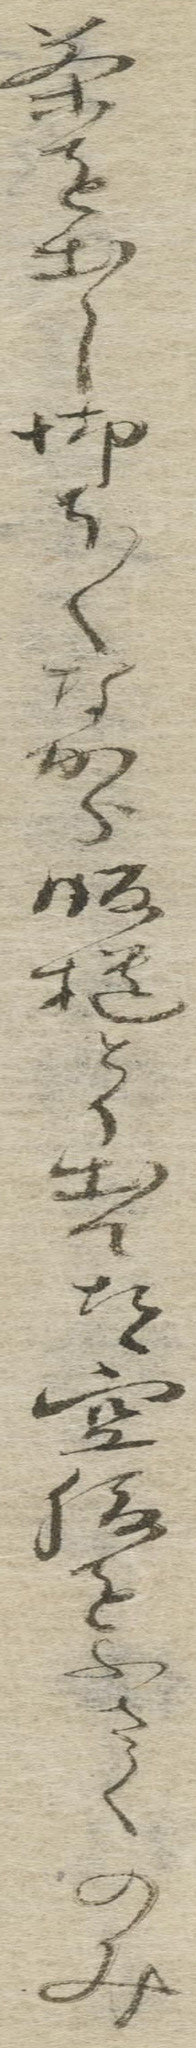茶を出し怖ち〳〵なから飯櫃とり出てたゝ空腹をふさくのみ
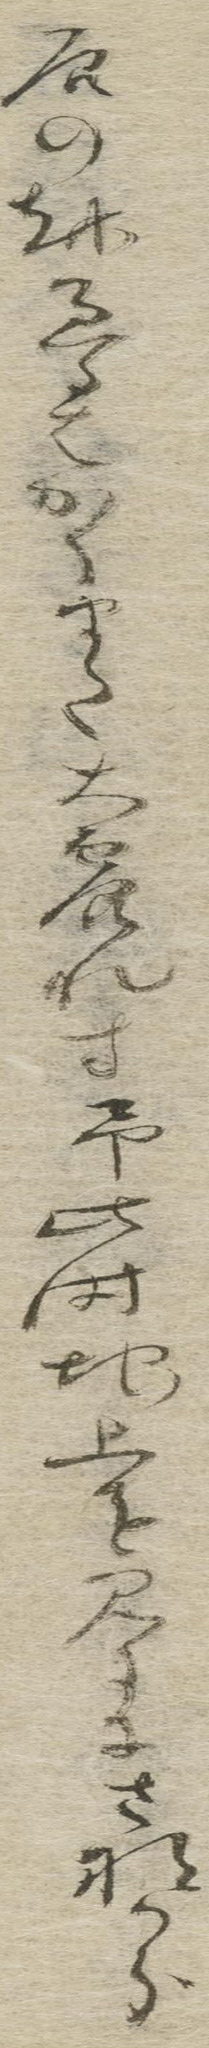辰の尅過るはかりまた大震れす予此時地上を見るにさなから
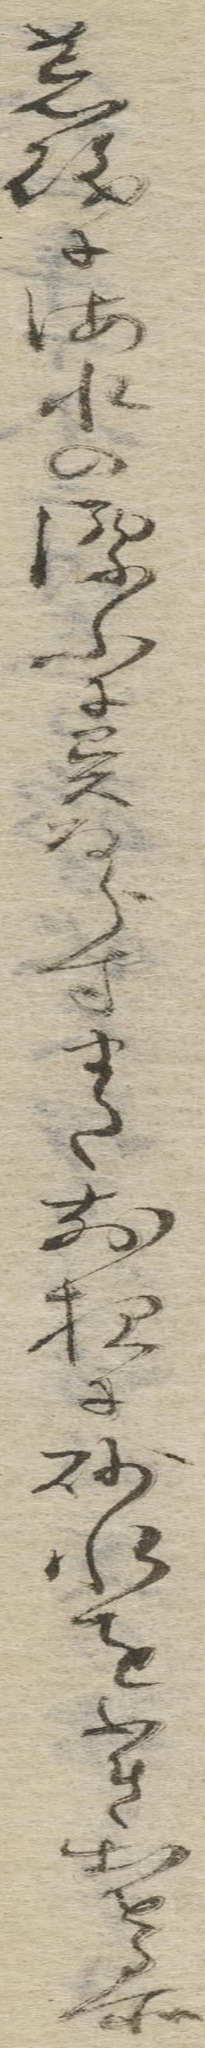荒れ磯に海水の漂ふに異ならすまた前夜に砂水をふき出をる所
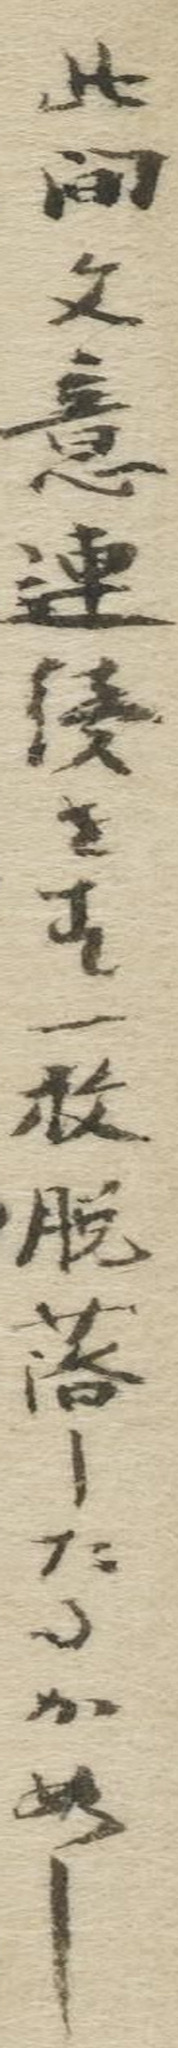此間文意連続せす壱枚脱落したるか如し
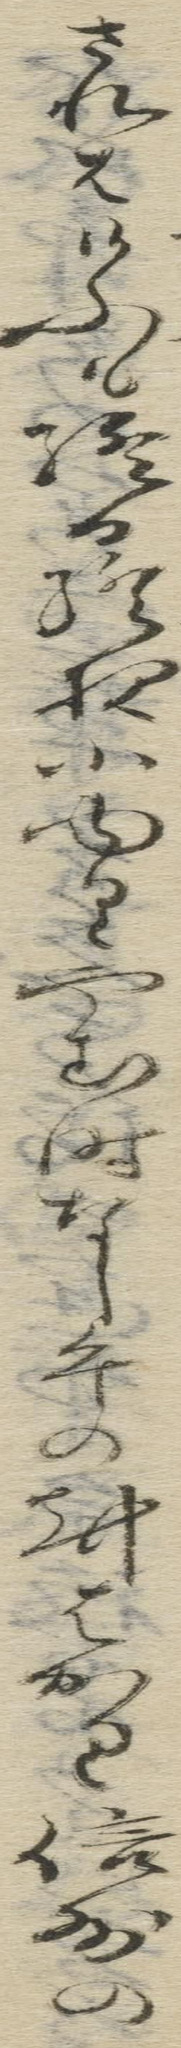されはけふも終る終夜小ゆりやむ時なし午の刻はかり信州の
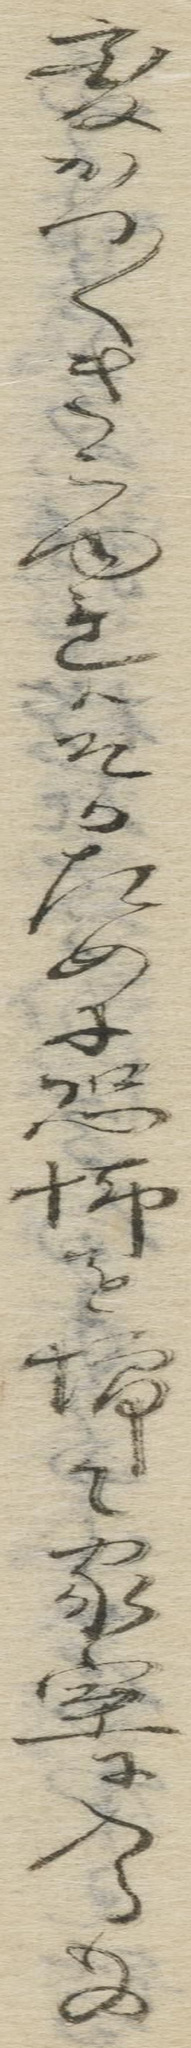変かつ〳〵きこゆれハそのために恐怖を増て家室に入るもの
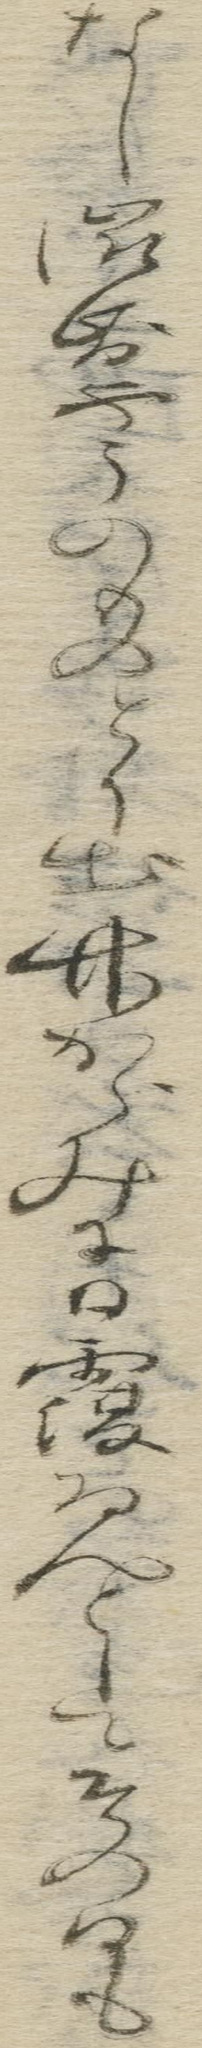なし渋紙やうのものとり出竹からみに日覆なんとしてもその日も
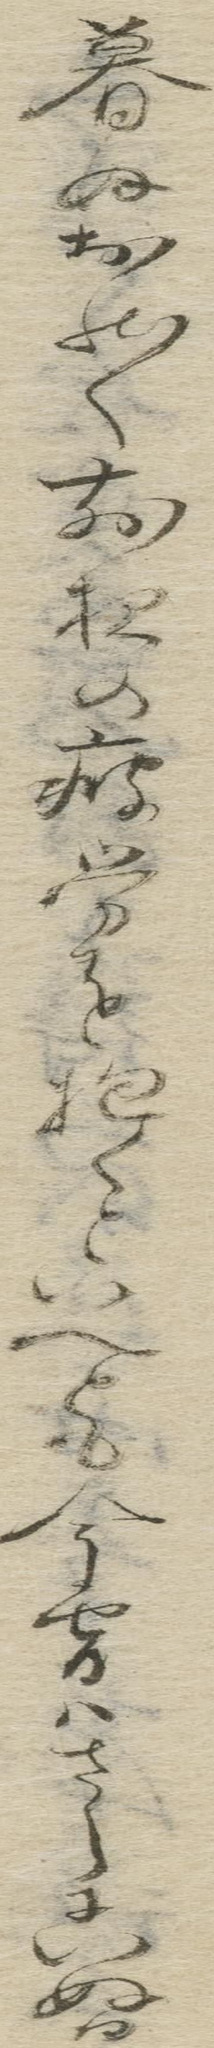暮れぬおの〳〵前夜の疲労を抱くといへとも今宵ハさらにいぬね
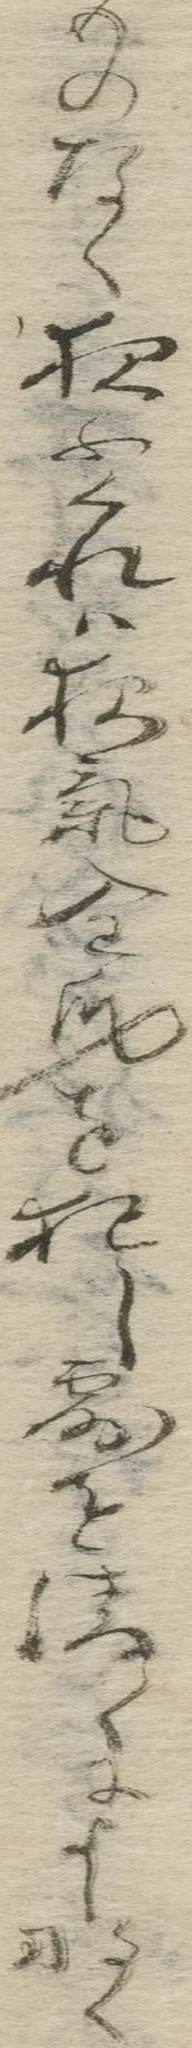ものなく夜にくれハ夜気全身を犯し処を清くニよしなく
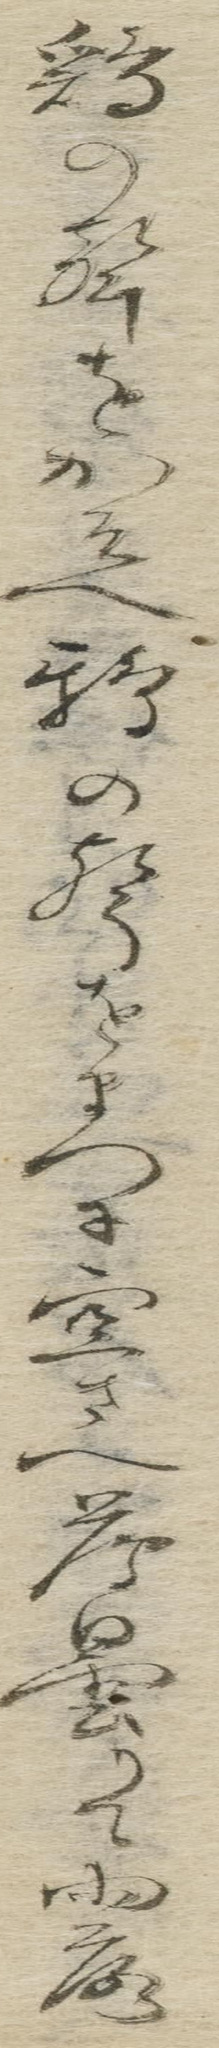鶏の声をかそへ鶏の声をまつに空さへ薄曇りて雨落
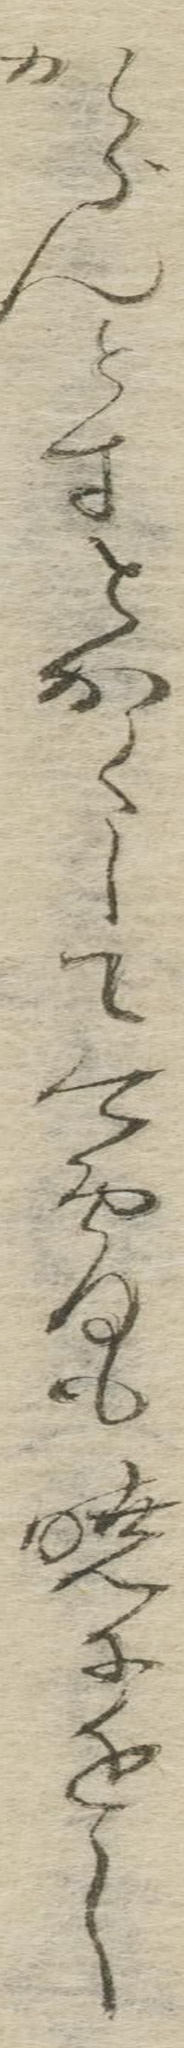からんとすとかして今宵も暁に近し
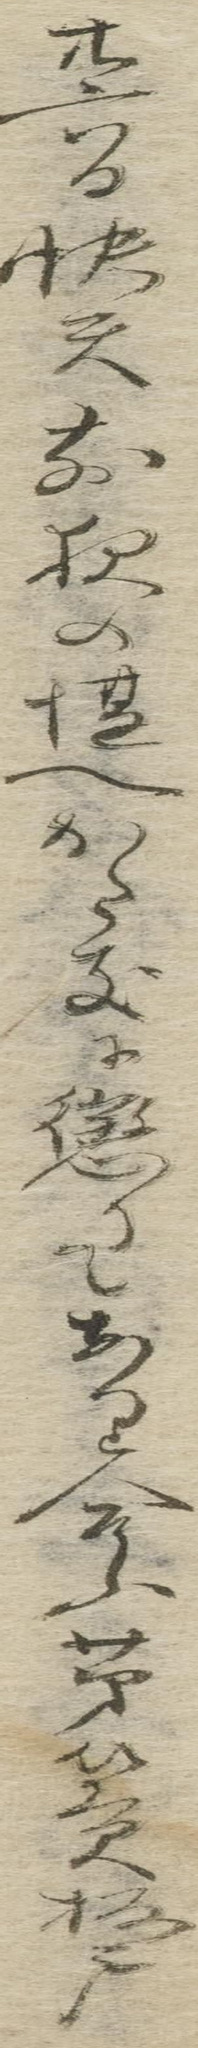廿六日快天前夜の堪えかたきに懲りてあり合ふ茅簀板戸
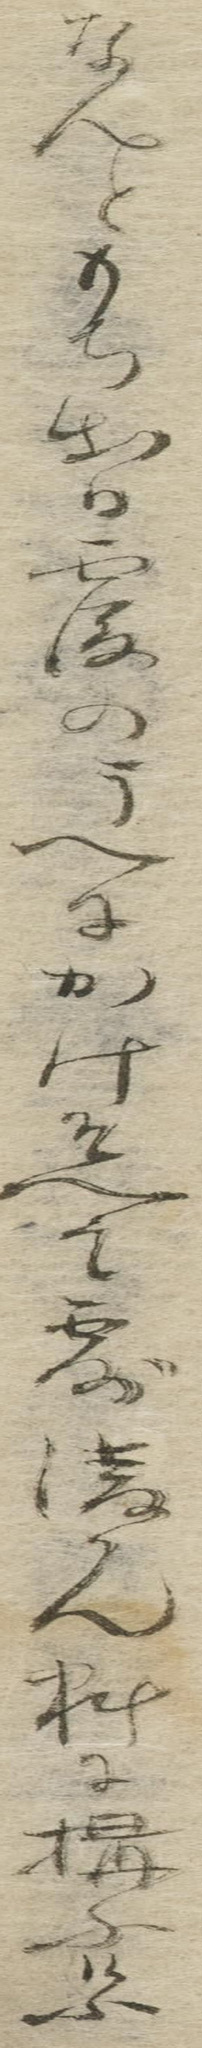なんともち出日覆のうへにかけそへて露凌かん料に構ふけふ
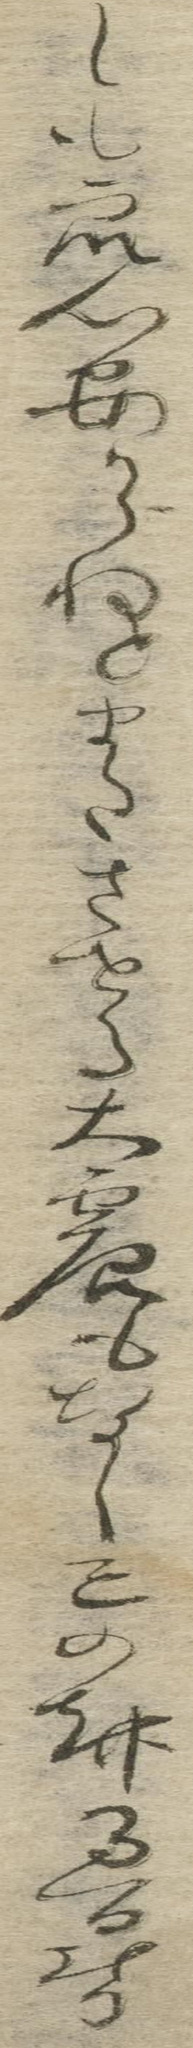しも衆心安からねとまたさをる大震もなし巳の刻過る計り

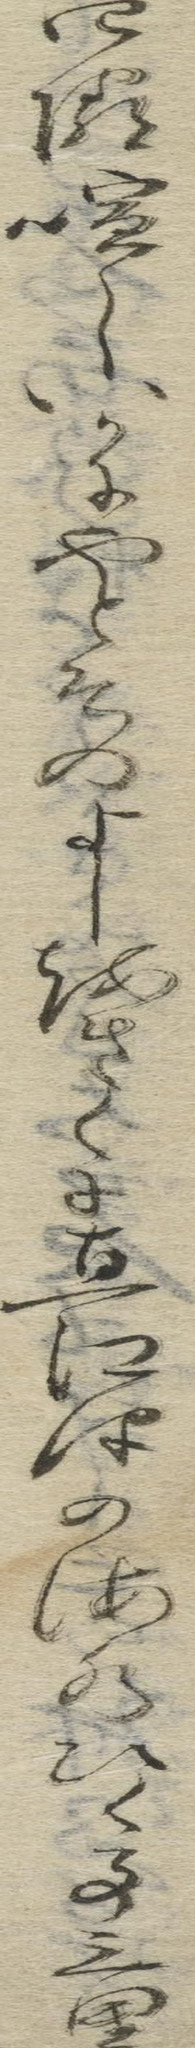四隣喧しいかにやとそのよしをきくに直江津の海水ひく事三里
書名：弘化丁未天變日記
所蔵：東京大学地震研究所図書室 Earthquake Research Institute Library, The University of Tokyo, JAPAN
